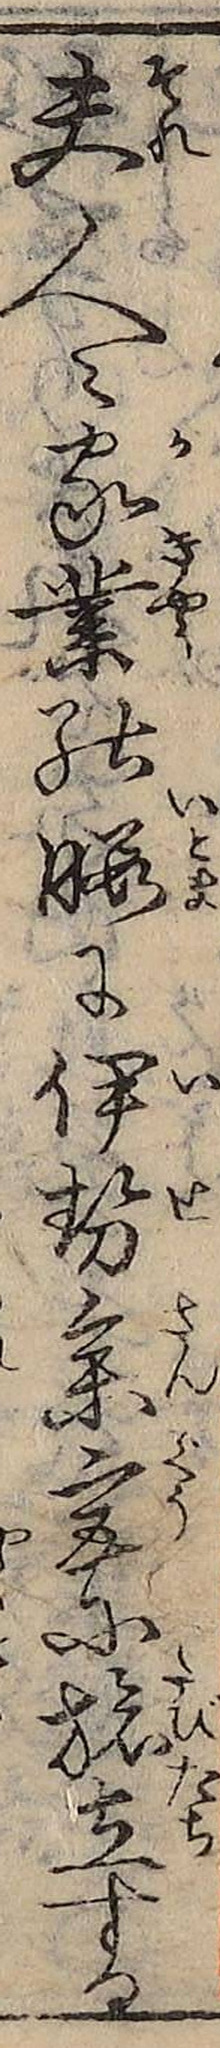夫人々家業の暇に伊勢参宮に旅立する
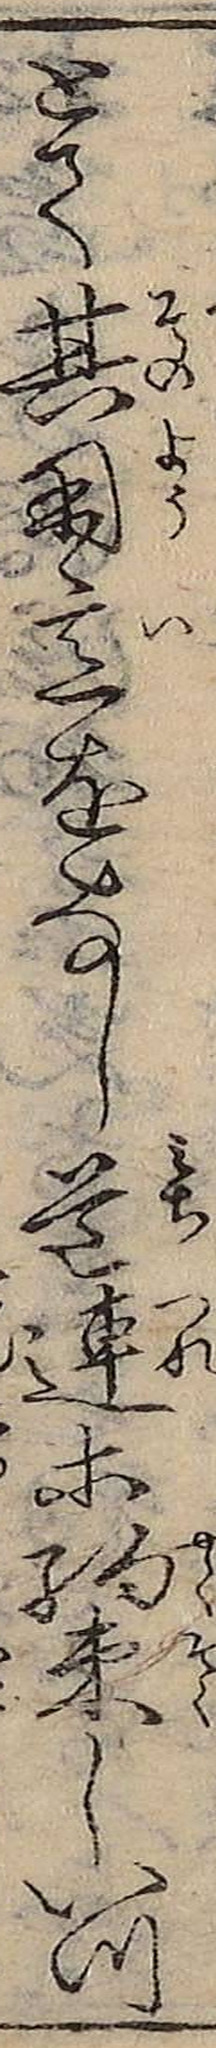とて其用意をなし道連等約束しいつ
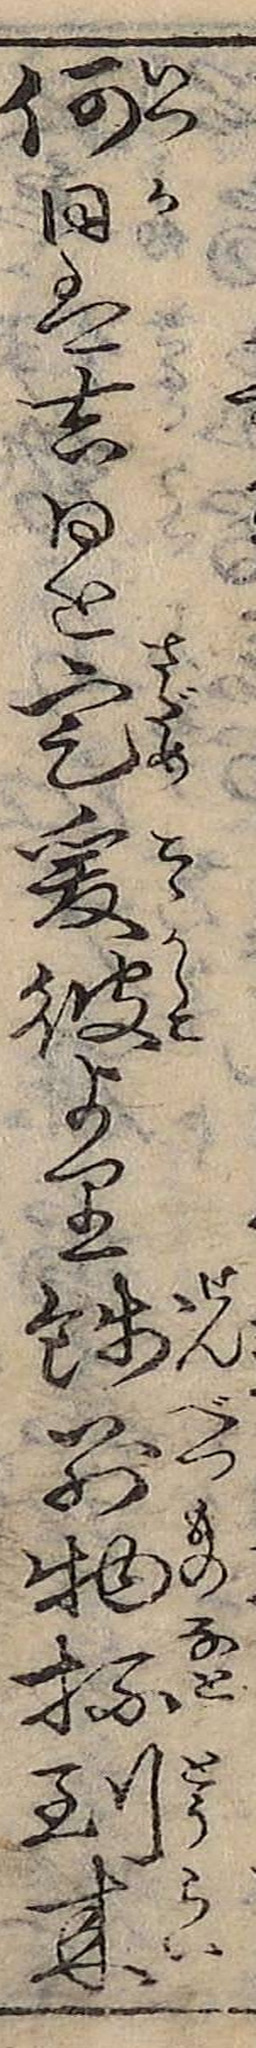何日は吉日と定爰彼より餞別物抔到来
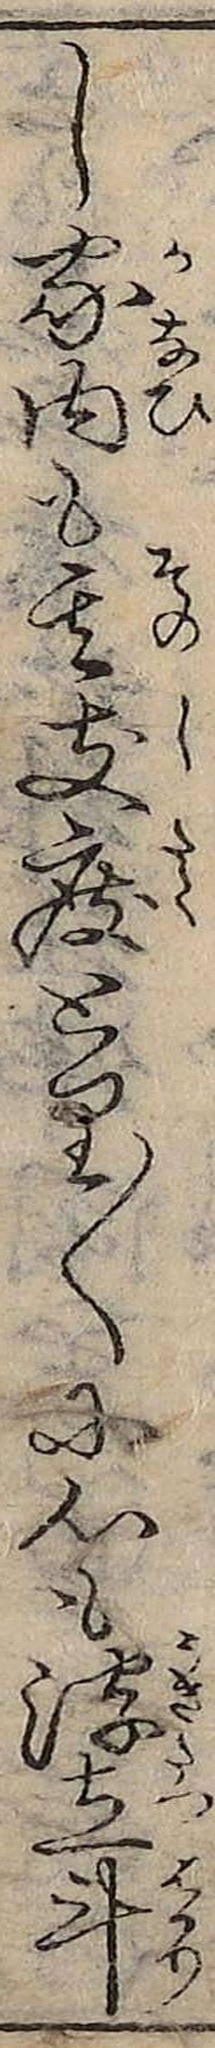し家内も其支度とり〳〵に心も浮立計
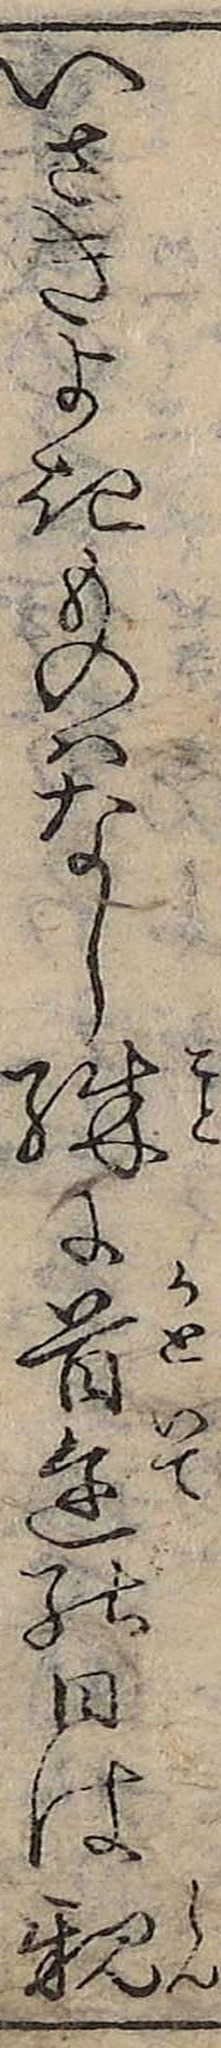いさきよきものはなし殊に首進の日は親
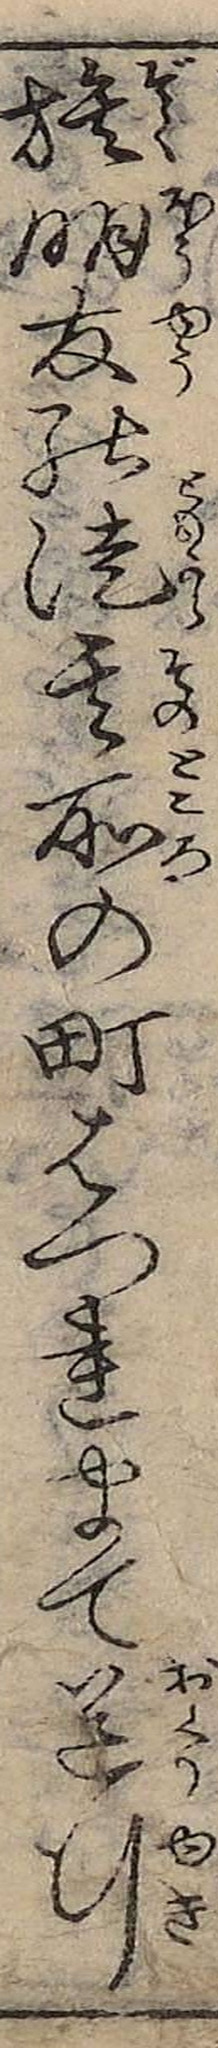族朋友の徒其所の町はつれまて送行
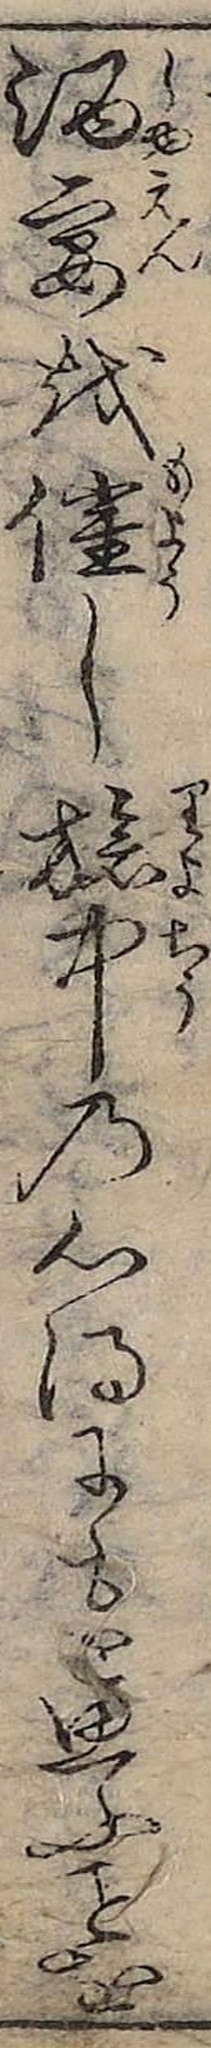酒宴を催し旅中の心得にもと思ふことを
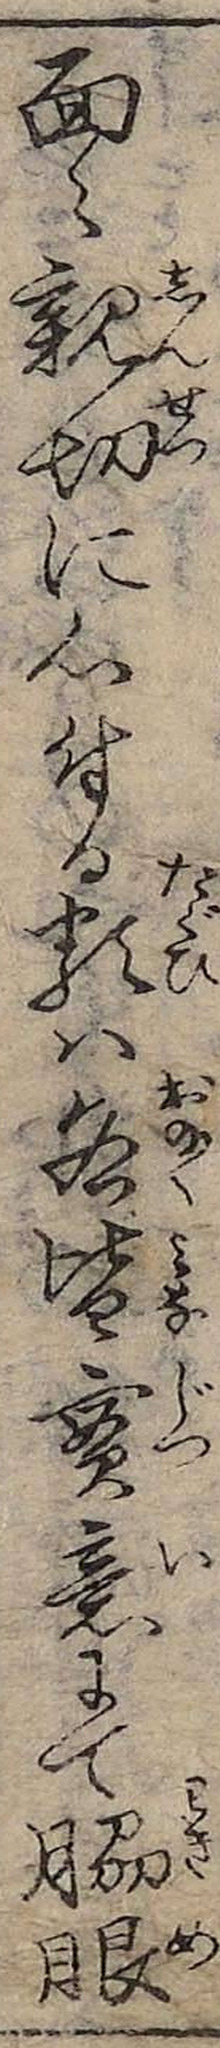面々親切に心付る類は各皆実意にて脇眼

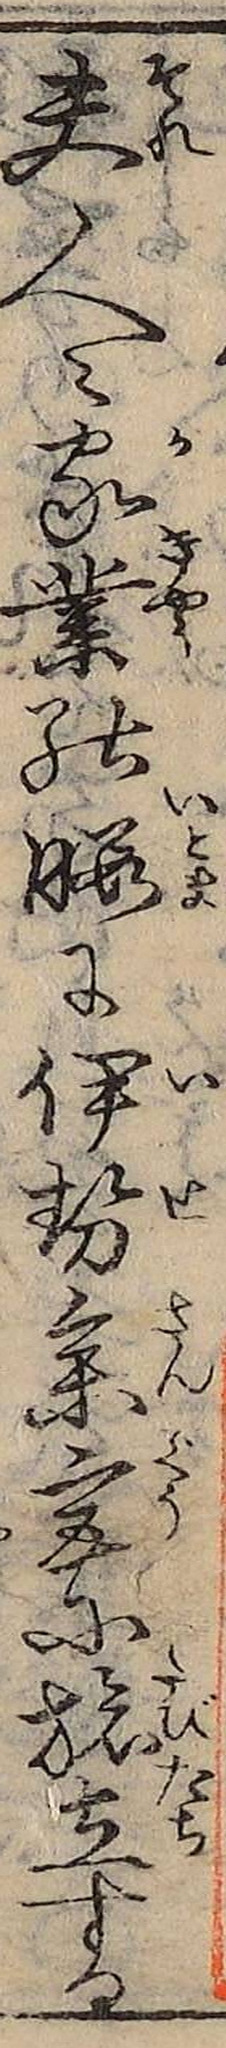夫人々家業の暇に伊勢参宮に旅立する
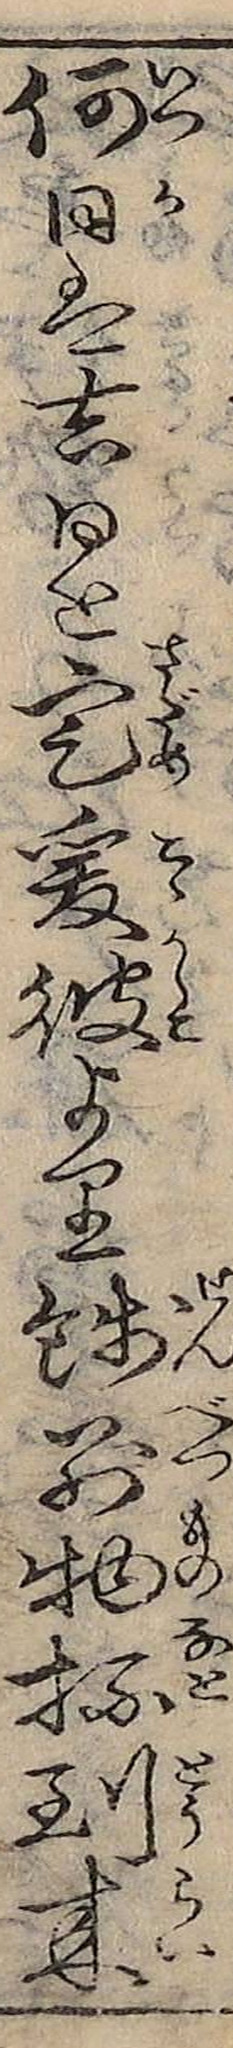何日は吉日と定爰彼より餞別物抔到来
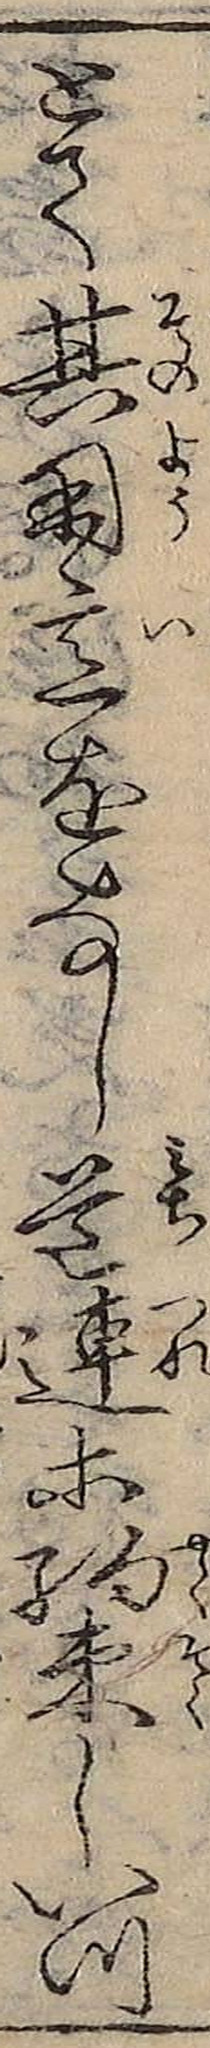とて其用意をなし道連等約束しいつ
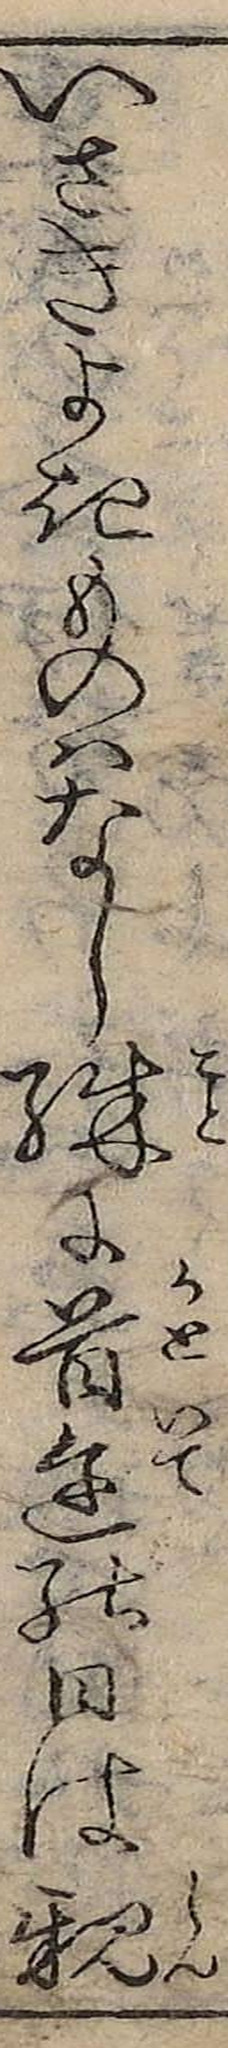いさきよきものはなし殊に首進の日は親
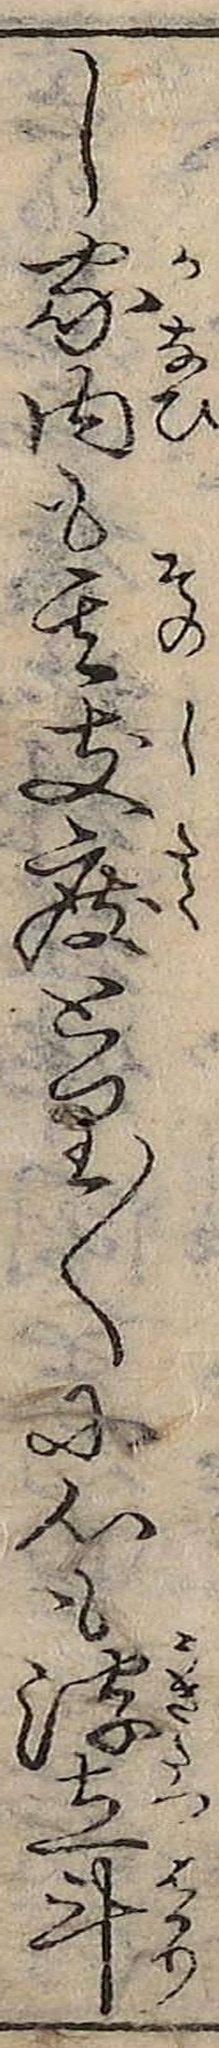し家内も其支度とり〳〵に心も浮立計
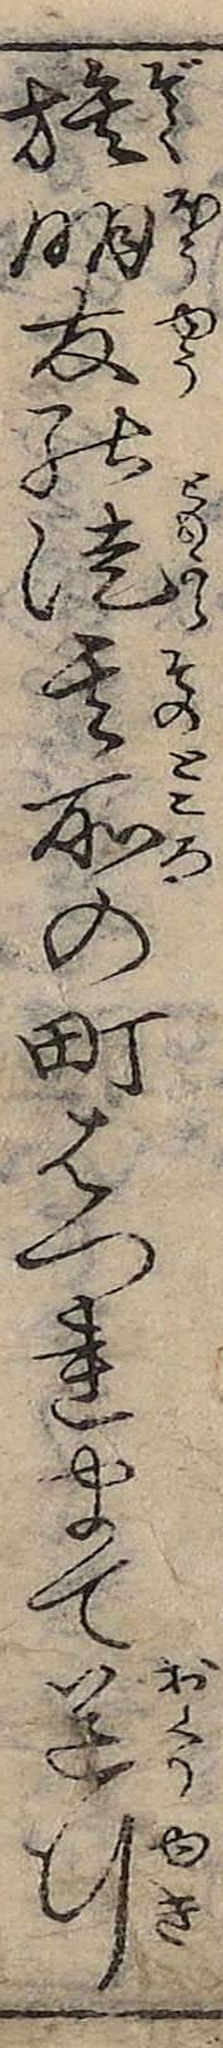族朋友の徒其所の町はつれまて送行
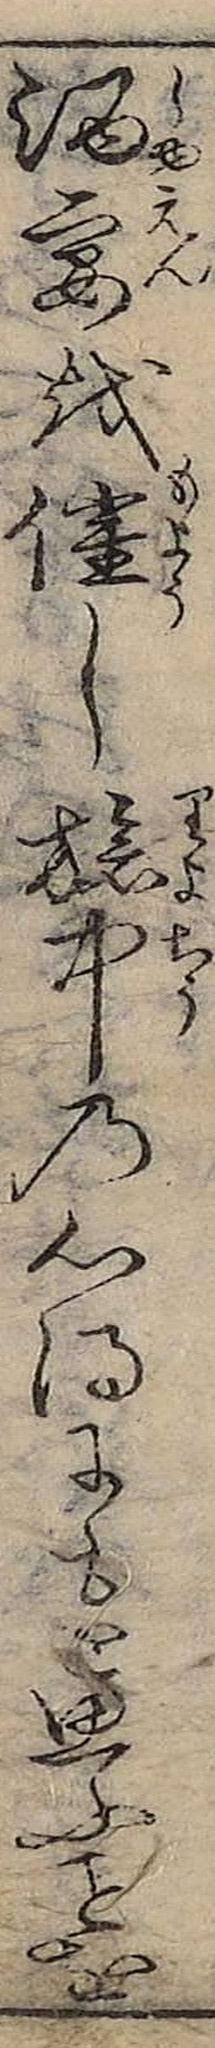酒宴を催し旅中の心得にもと思ふことを
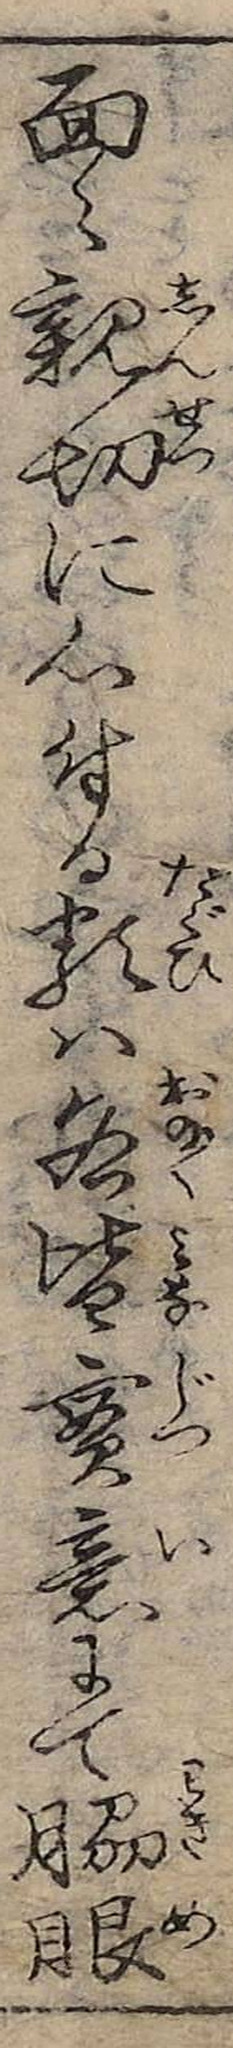面々親切に心付る類は各皆実意にて脇眼
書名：旅行用心集
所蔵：神戸大学附属図書館 国文学研究資料館
